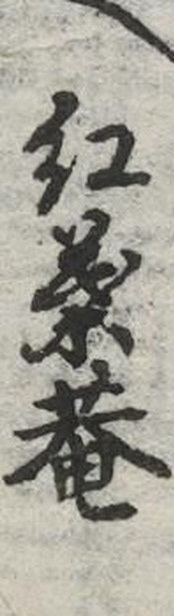紅葉庵
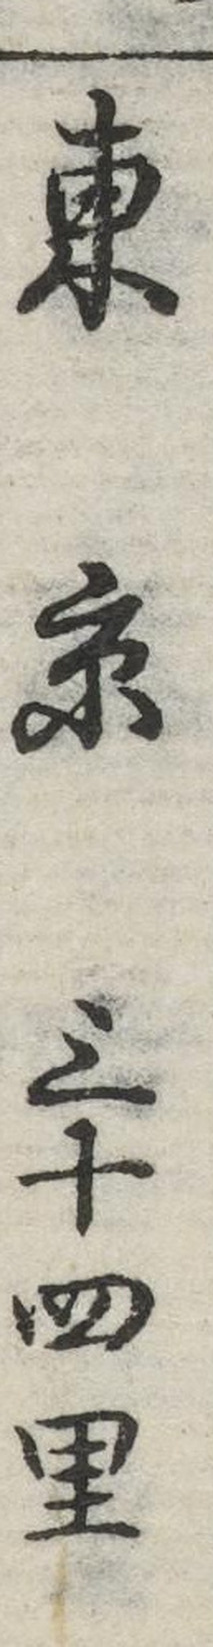東京三十四里
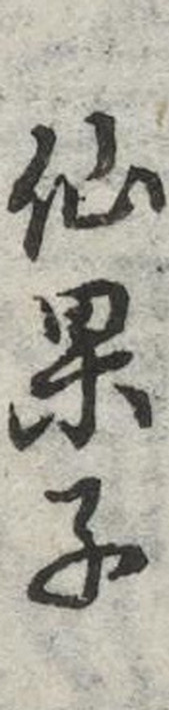仙果子
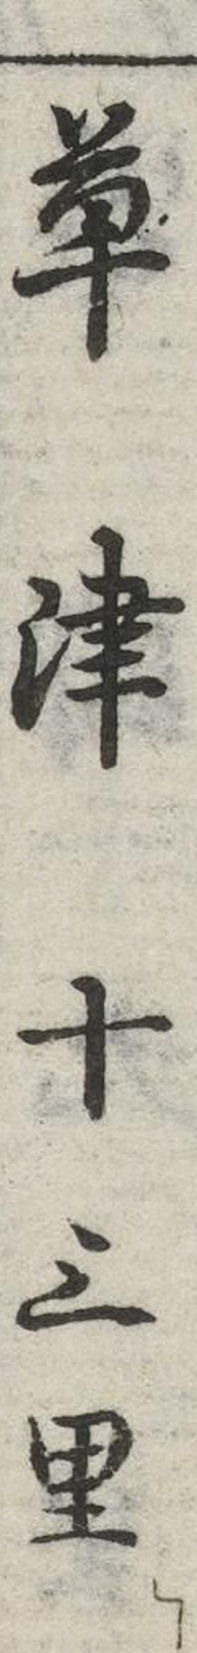草津十三里
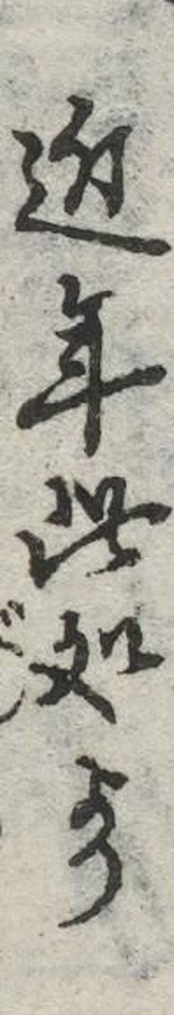近年此処より
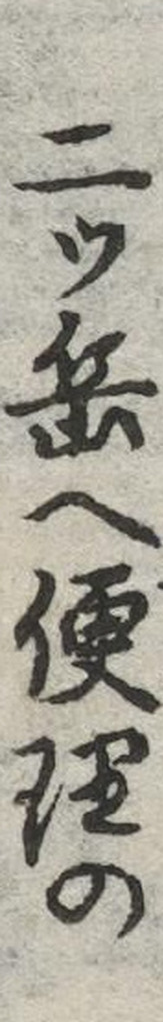二ツ岳へ便理の
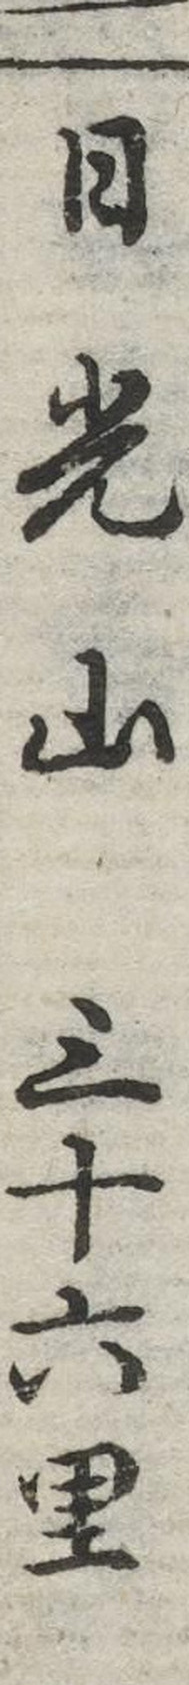日光山三十六里
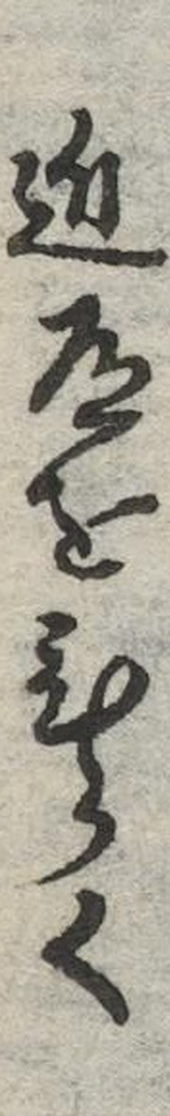近道をひらく
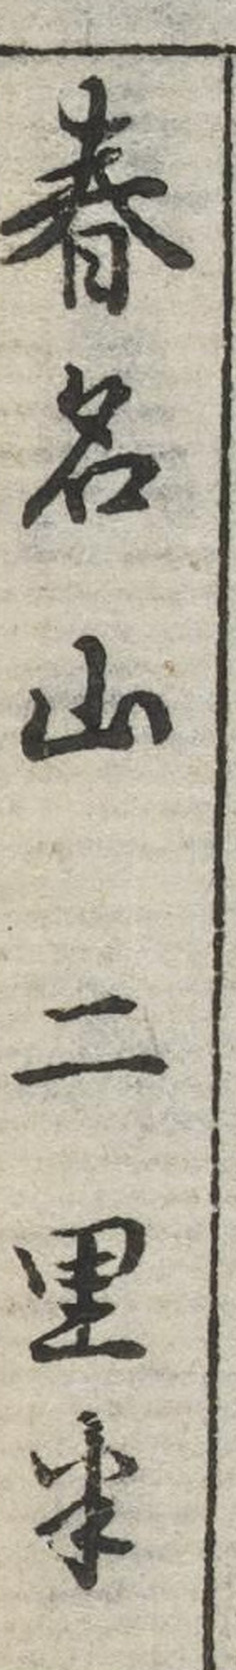春名山二里半

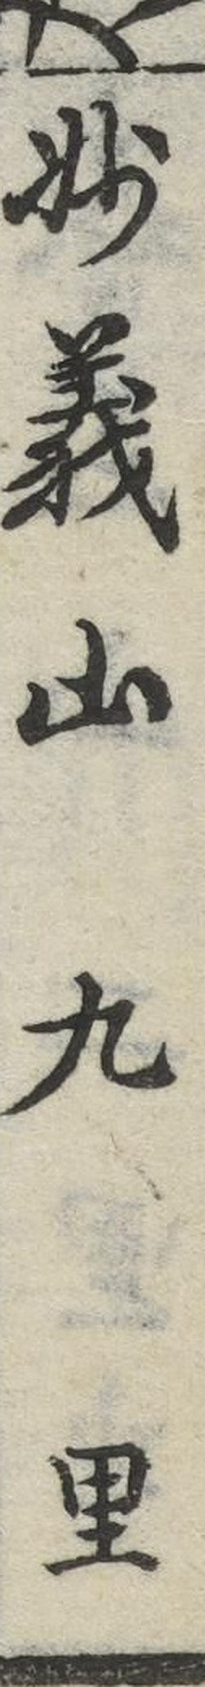妙義山九里
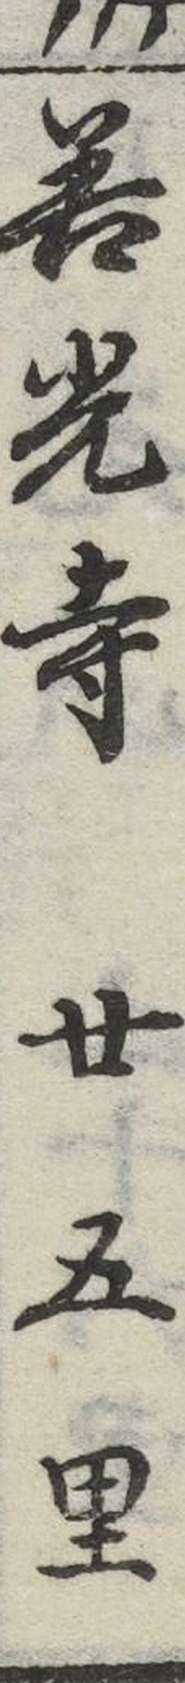善光寺廿五里
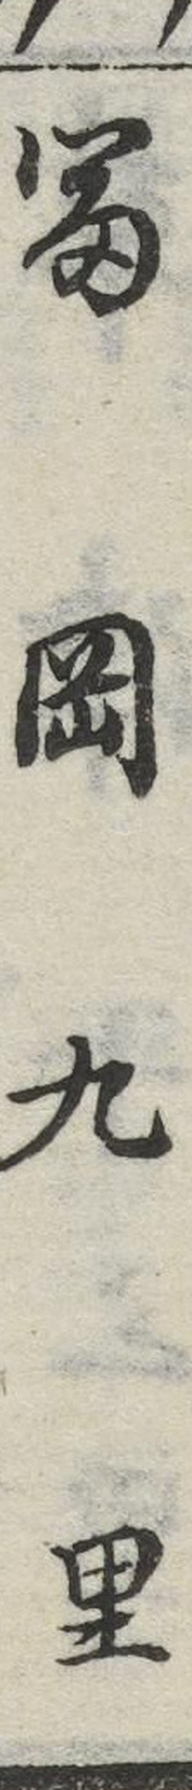冨岡九里
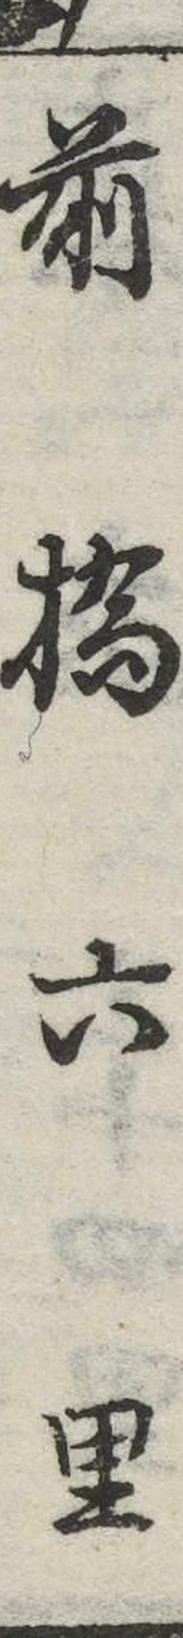前橋六里
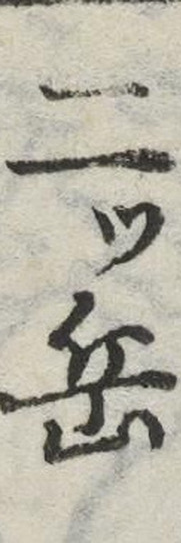二ツ岳
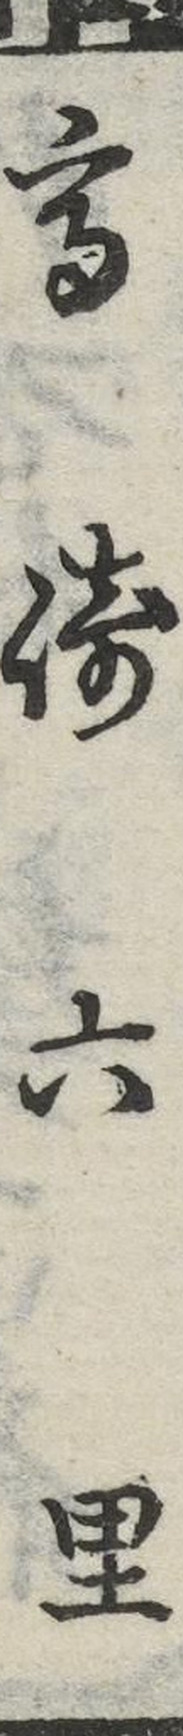高崎六里
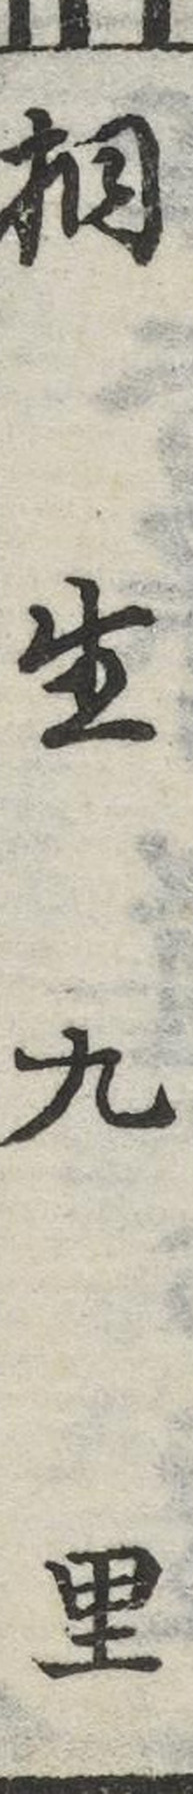相生九里
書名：諸國温泉遊覽記　全
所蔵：東京大学地震研究所図書室 Earthquake Research Institute Library, The University of Tokyo, JAPAN
